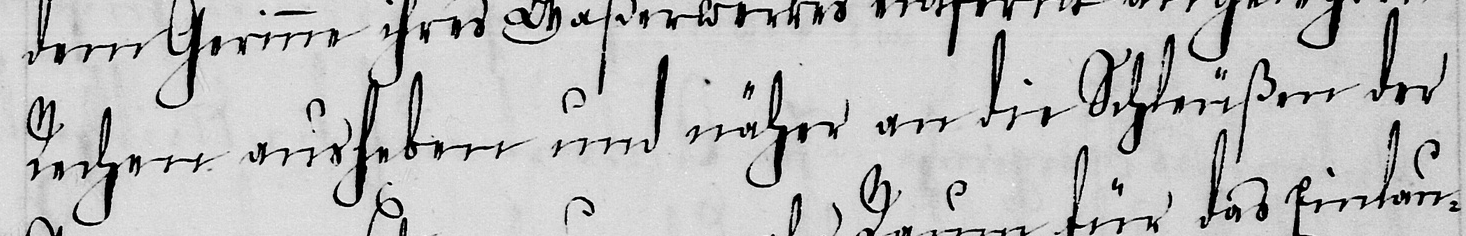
Rechen ausheben und näher an die Schleußen der
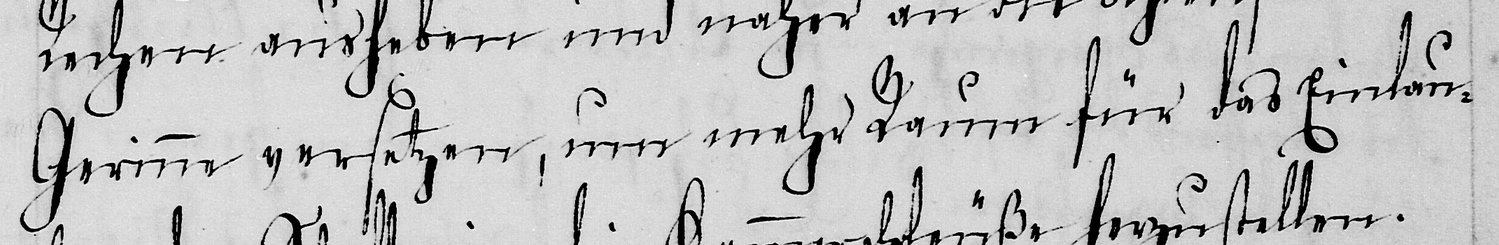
Gerinne versetzen, um mehr Raum für das Einlau¬
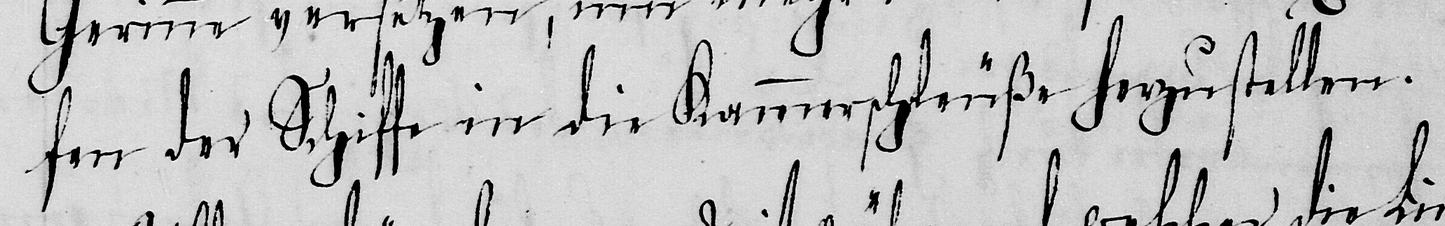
fen der Schiffe in die Kammerschleuße herzustellen.
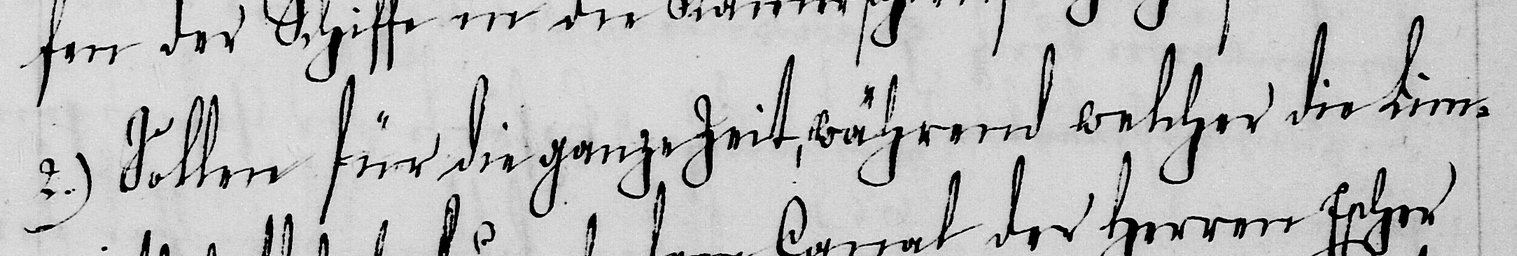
2.) Sollen für die ganze Zeit, während welcher die Lim¬
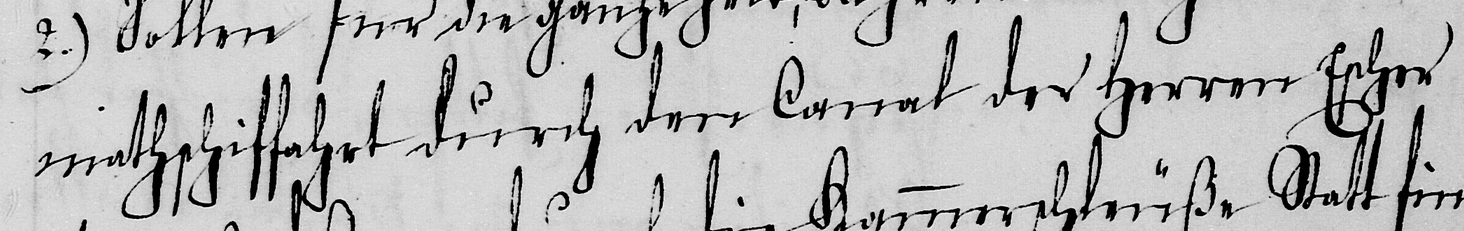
mathschiffahrt durch den Canal der Herren Escher
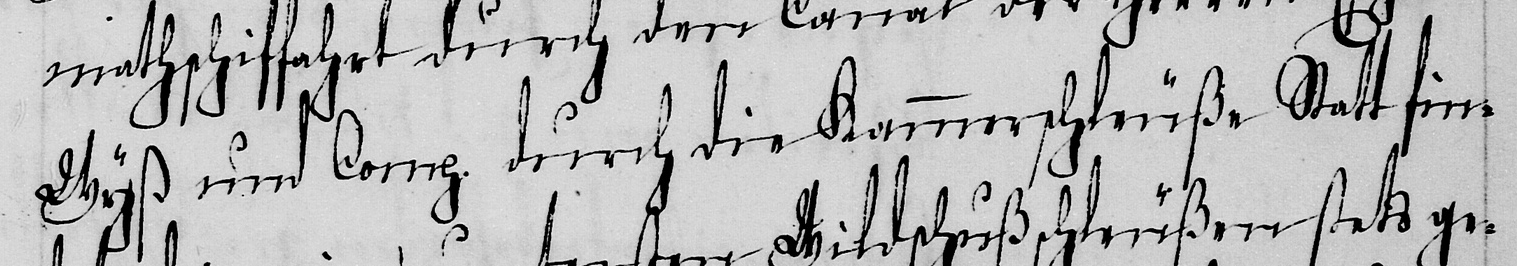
Wyß und Comp. durch die Kammerschleuße Statt fin¬
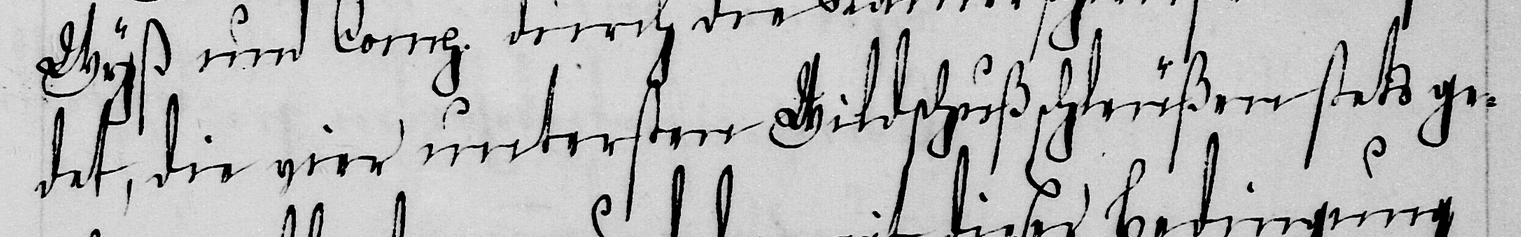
det, die vier untersten Wildschußschleußen stets ge¬
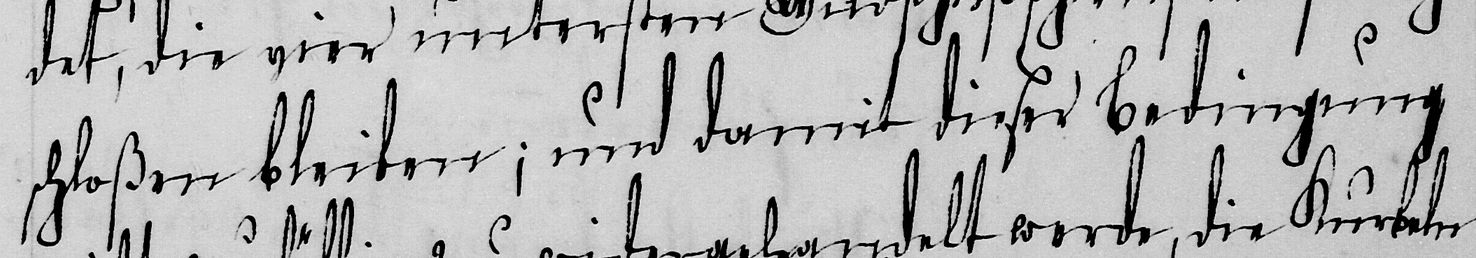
schloßen bleiben; und damit dieser Bedingung
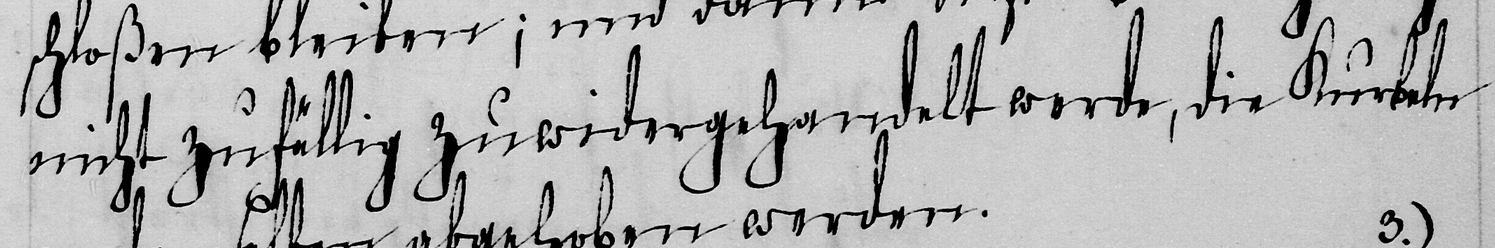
nicht zufällig zuwidergehandelt werde, die Kurbeln
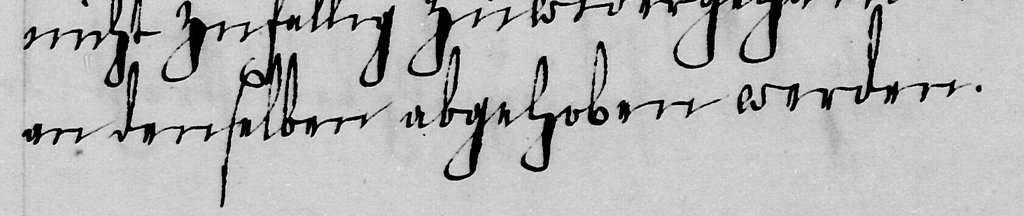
an denselben abgehoben werden.
